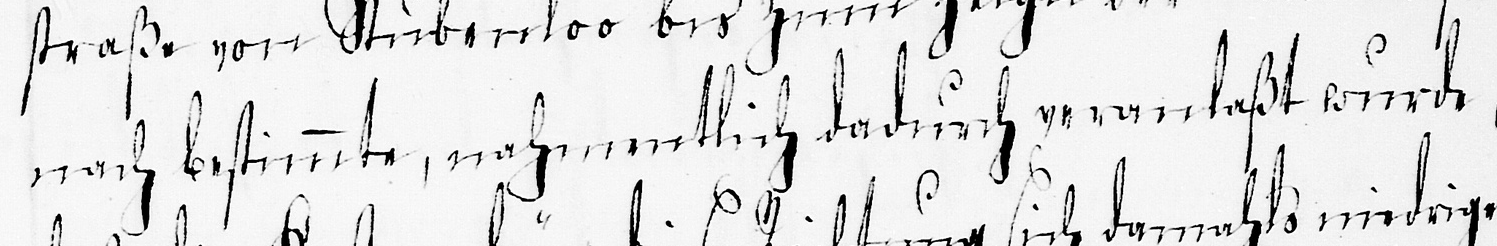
nach bestimmte, nahmentlich dadurch veranlaßt wurde,
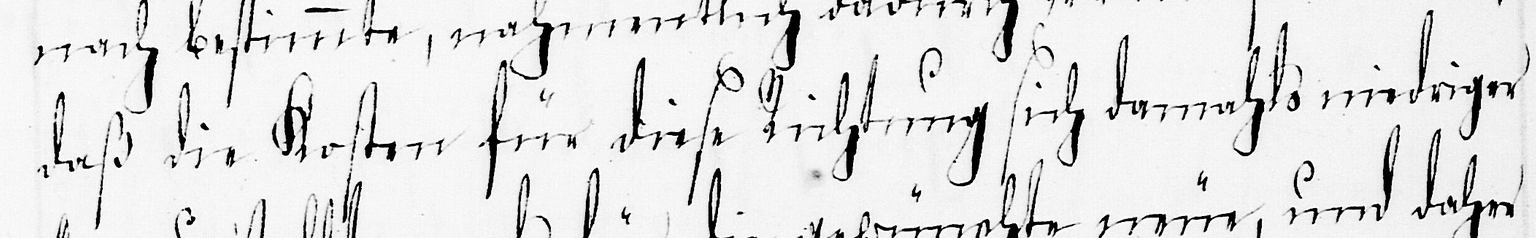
daß die Kosten für diese Richtung sich damahls niedriger
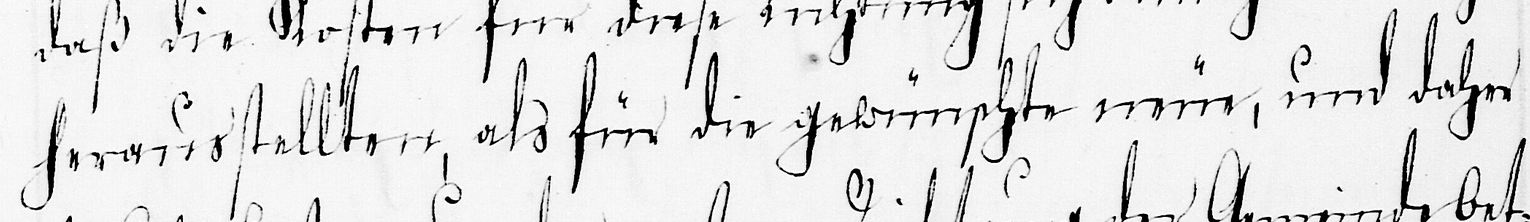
herausstellten, als für die gewünschte neue, und daher
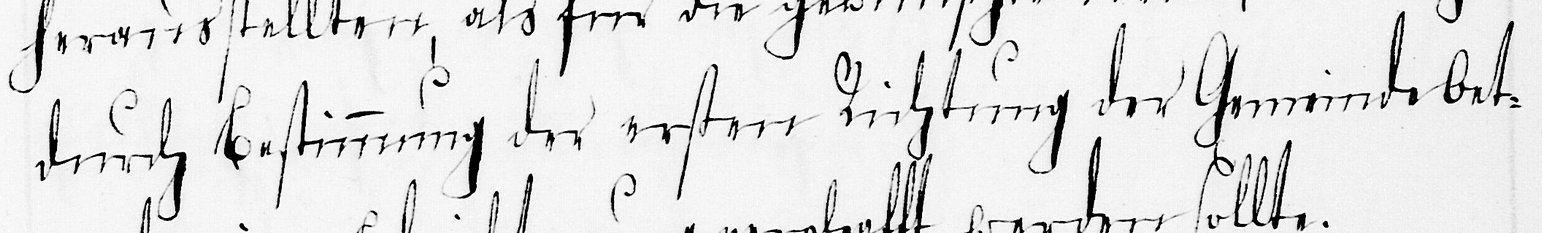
durch Bestimmung der ersten Richtung der Gemeinde Oet¬
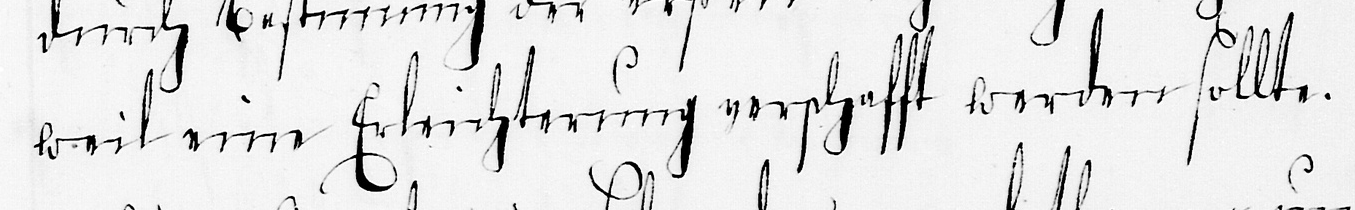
weil eine Erleichterung verschafft werden sollte.
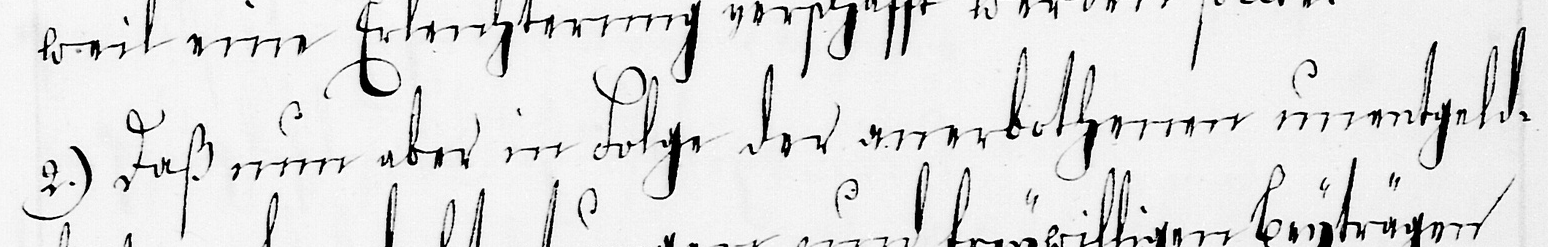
2.) Daß nun aber in Folge der anerbothenen unentgeld¬
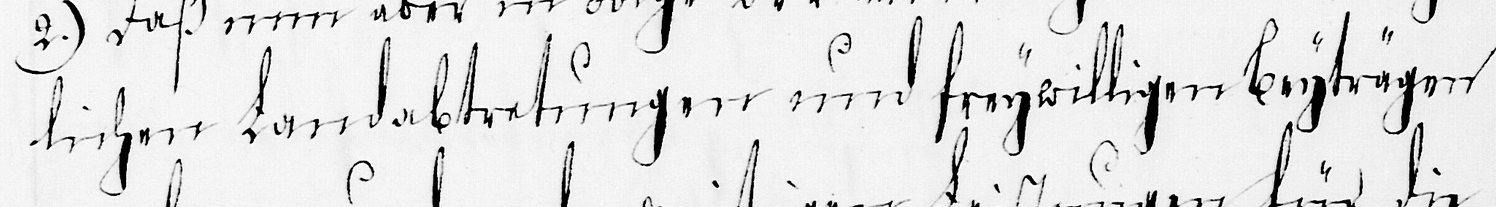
lichen Landabtretungen und freywilligen Beyträgen
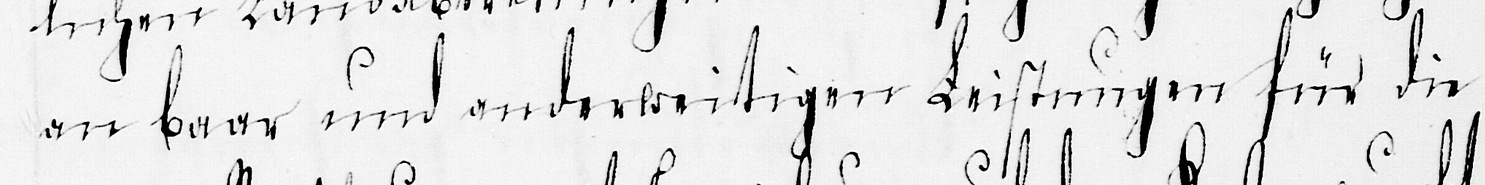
an baar und anderweitigen Leistungen für die
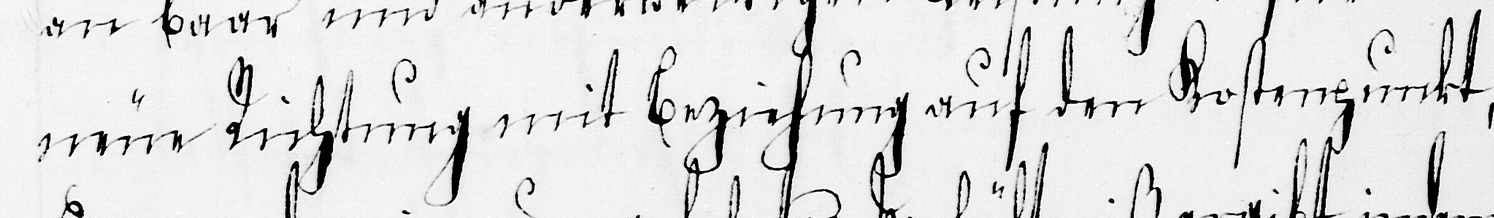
neue Richtung mit Beziehung auf den Kostenpunkt,
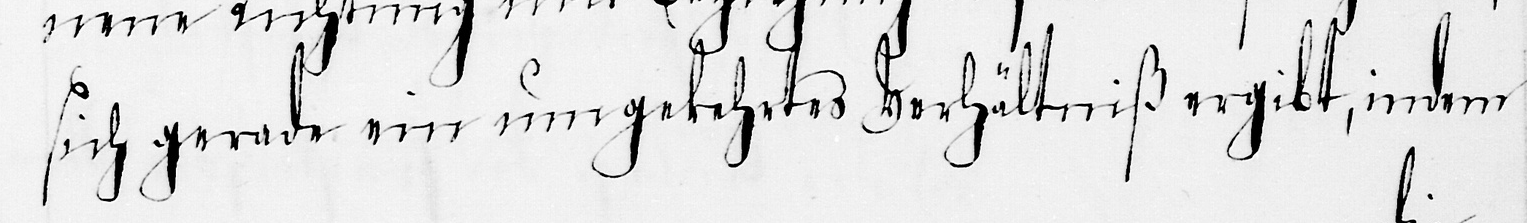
sich gerade ein umgekehrtes Verhältniß ergibt, indem
